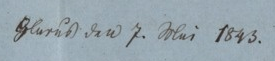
Glarus den 7. Mai 1843.
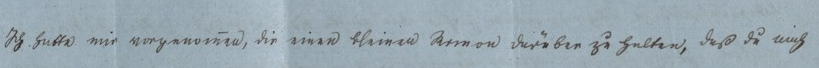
Ich hatte mir vorgenommen, dir einen kleinen Sermon darüber zu halten, daß du mich
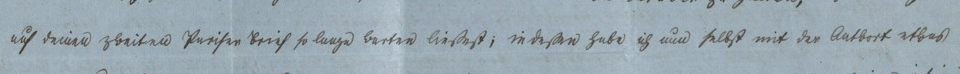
auf deinen zweiten Pariser Brief so lange warten ließest; indessen habe ich nun selbst mit der Antwort etwas
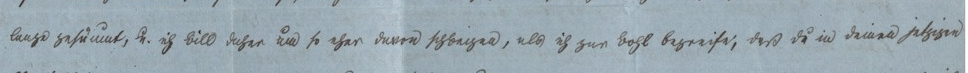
lange gesäumt, u. ich will daher um so eher davon schweigen, als ich gar wohl begreife, daß du in deinen jetzigen
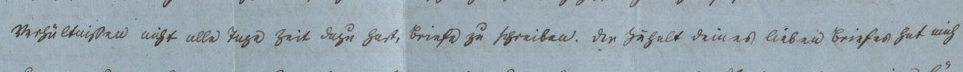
Verhältnissen nicht alle Tage Zeit dazu hast, Briefe zu schreiben. Der Innhalt deines lieben Briefes hat mich
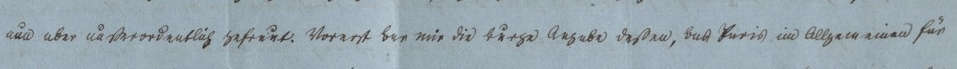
nun aber außerordentlich gefreut. Vorerst war mir die kurze Angabe dessen, was Paris im Allgemeinen für
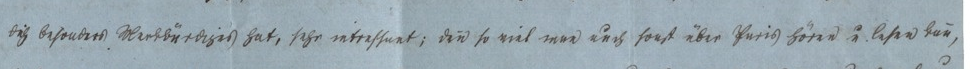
dich besonders Merkwürdiges hat, sehr intressant; denn soviel man auch sonst über Paris hören u. lesen kann,
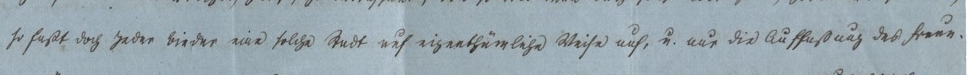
so faßt doch Jeder wieder eine solche Stadt auf eigenthümliche Weise auf, u. nur die Auffaßung des Freun-
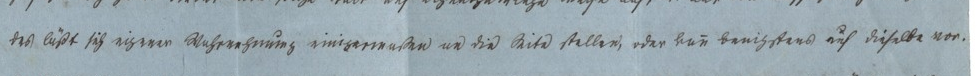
des läßt sich eigner Wahrnehmung einigermaßen an die Seite stellen, oder kann wenigstens auf dieselbe vor-
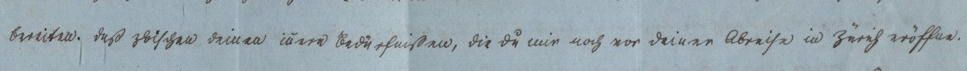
bereiten. Daß zwischen deinen innern Bedürfnissen, die du mir noch vor deiner Abreise in Zürich eröffne-
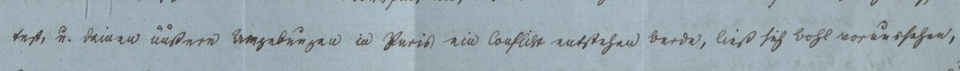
test, u. deinen äußern Umgebungen in Paris ein Conflikt entstehen werde, ließ sich wohl voraussehen,
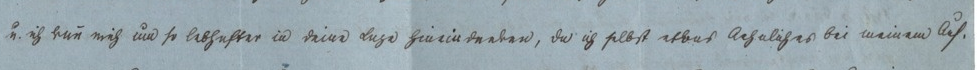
u. ich kann mich um so lebhafter in deine Lage hineindenken, da ich selbst etwas Aehnliches bei meinem Auf-
